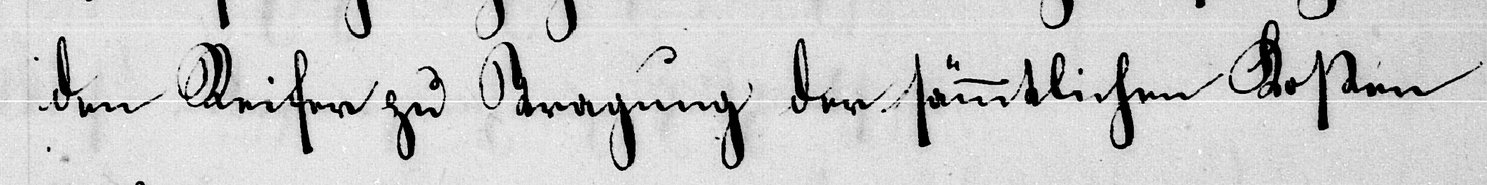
den Reifer zu Tragung der sämmtlichen Kosten
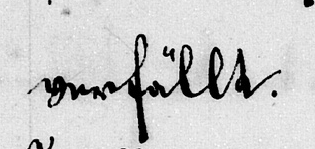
verfällt.
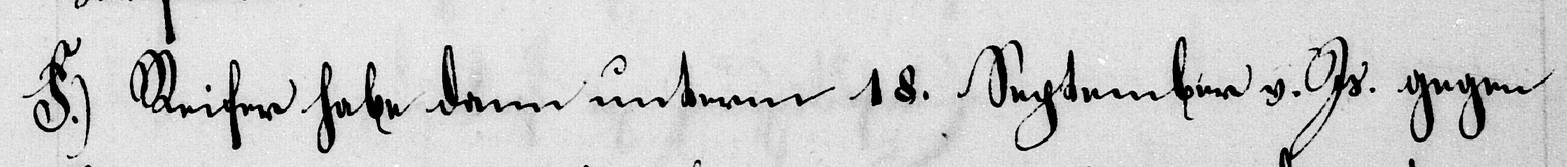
F.) Reifer habe dann unterm 18. September v. Js. gegen
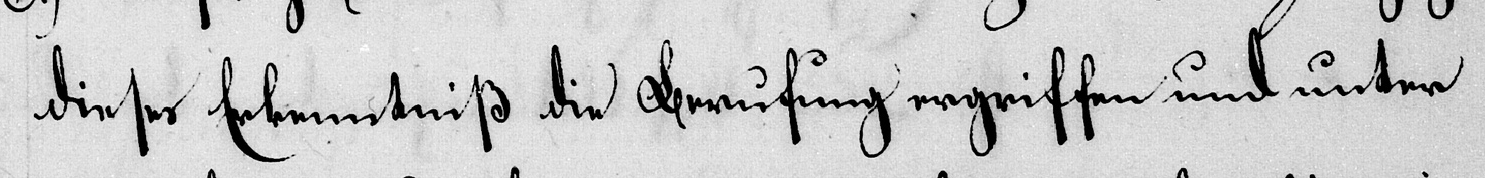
dieses Erkenntniß die Berufung ergriffen und unter
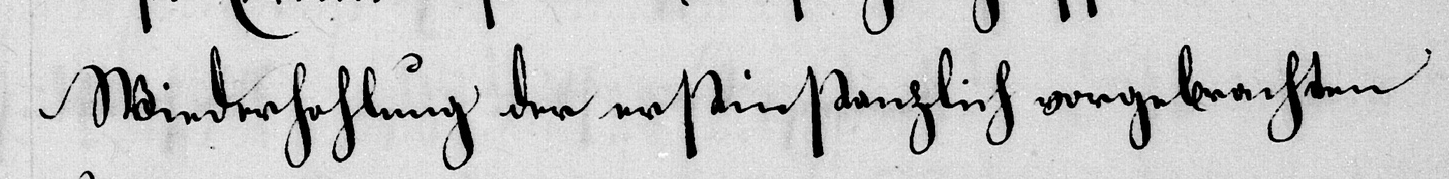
Wiederhohlung der erstinstanzlich vorgebrachten
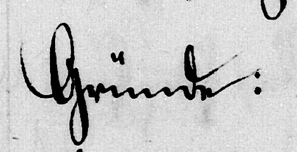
Gründe:
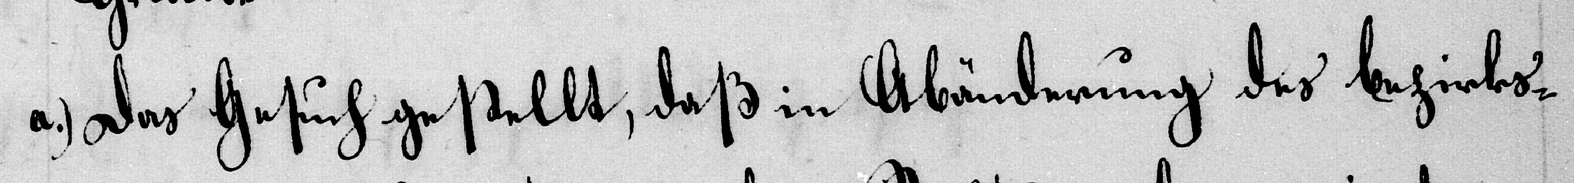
a.) Das Gesuch gestellt, daß in Abänderung des bezirks¬
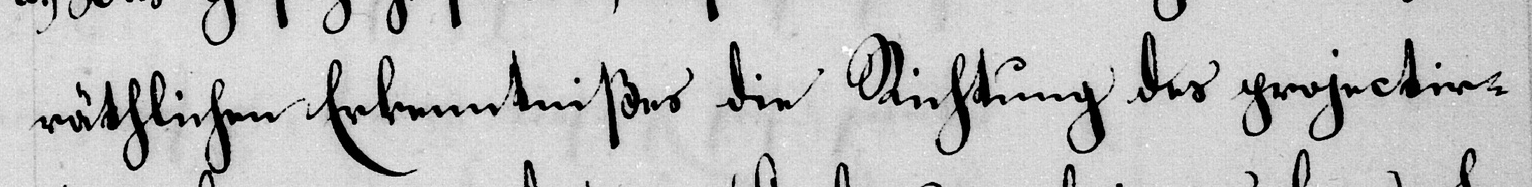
räthlichen Erkenntnißes die Richtung des projectir¬
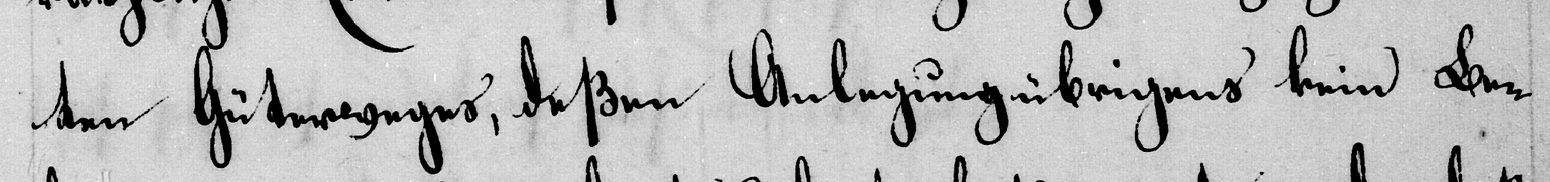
ten Güterweges, deßen Anlegung übrigens kein Be¬
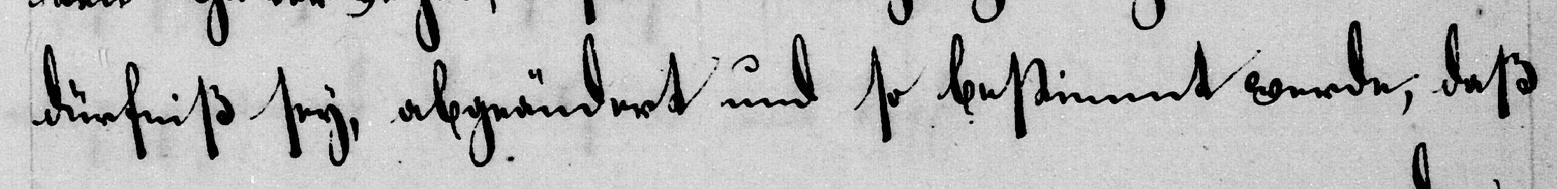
dürfniß sey, abgeändert und so bestimmt werde, daß
